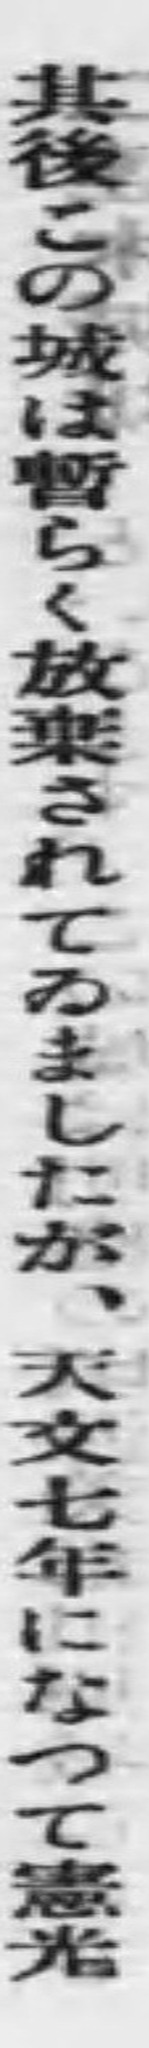其後この城は暫らく放棄されてゐましたが、天文七年になつて憲光
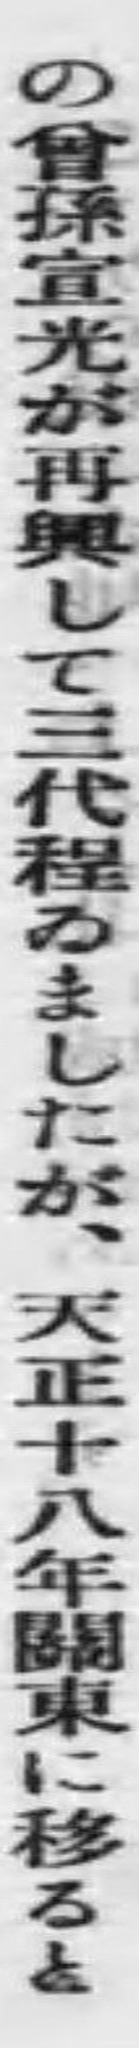の曽孫宣光が再興して三代程ゐましたが、天正十八年関東に移ると
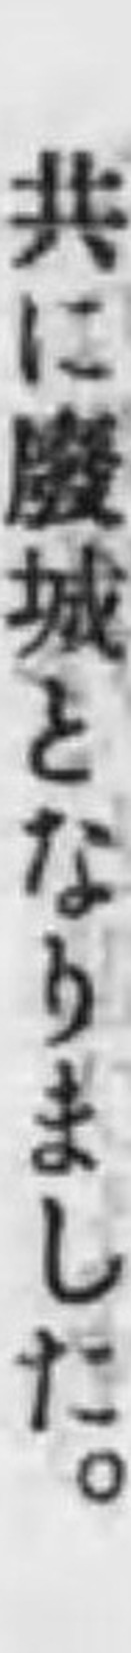共に廃城となりました。
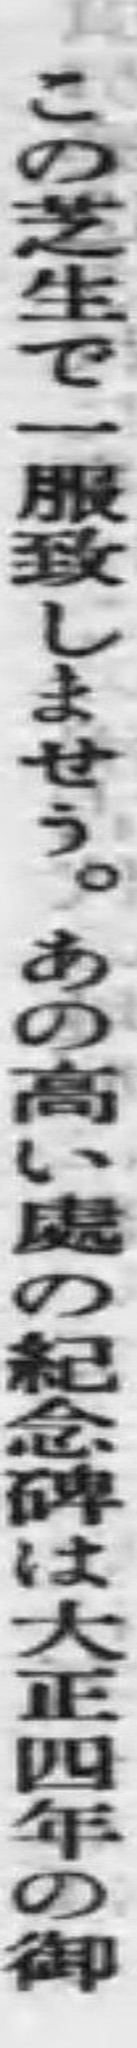この芝生で一服致しませう。あの高い処の紀念碑は大正四年の御
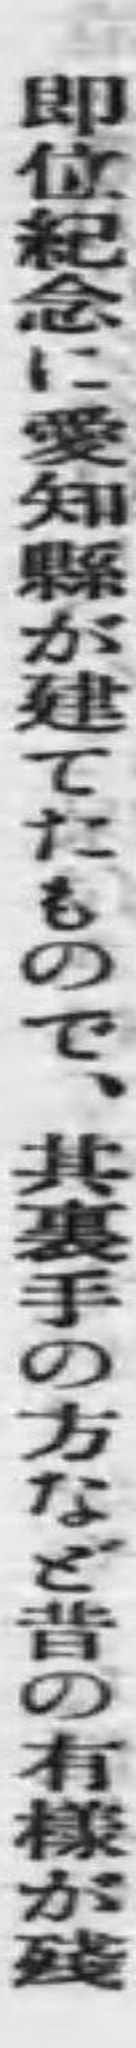即位紀念に愛知県が建てたもので、其裏手の方など昔の有様が残
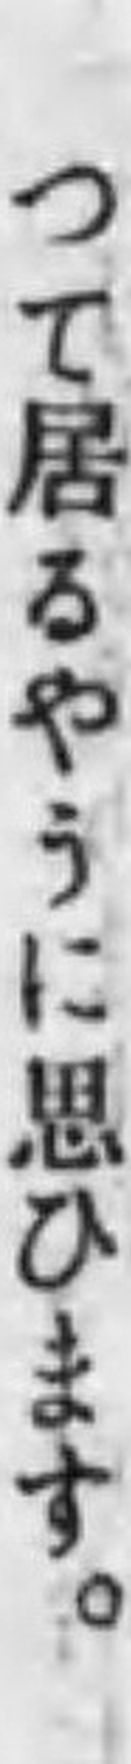つて居るやうに思ひます。
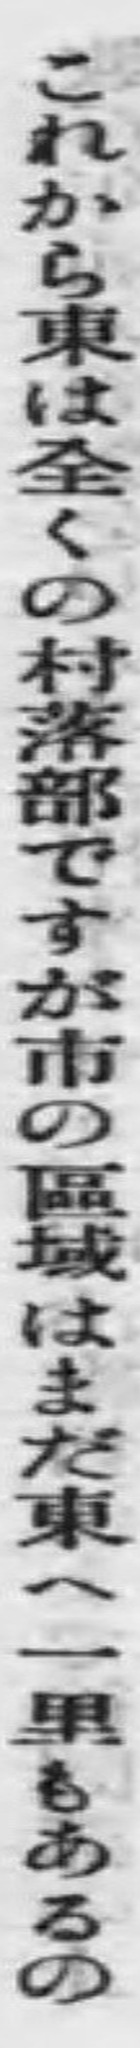これから東は全くの村落部ですが市の区域はまだ東へ一里もあるの
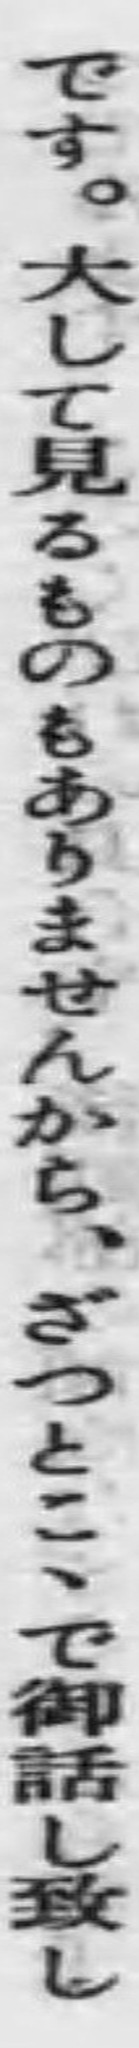です。大して見るものもありませんから、ざつとこゝで御話し致し
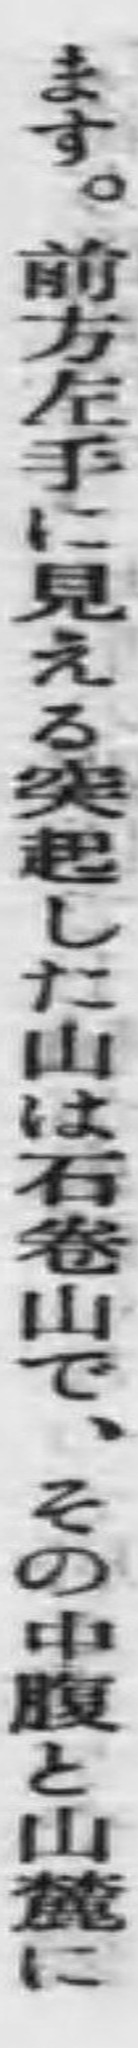ます。前方左手に見える突起した山は石巻山で、その中腹と山麓に
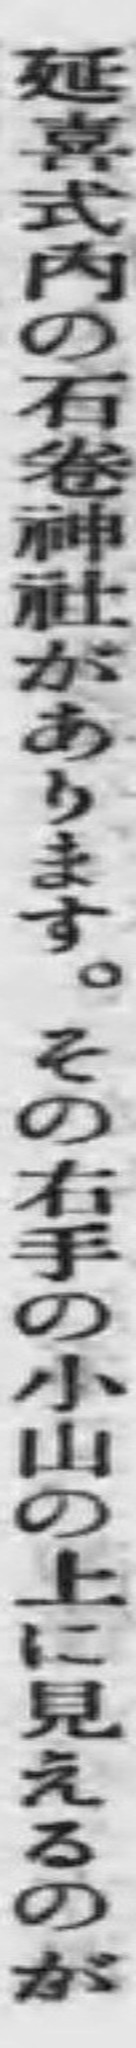延喜式内の石巻神社があります。その右手の小山の上に見えるのが
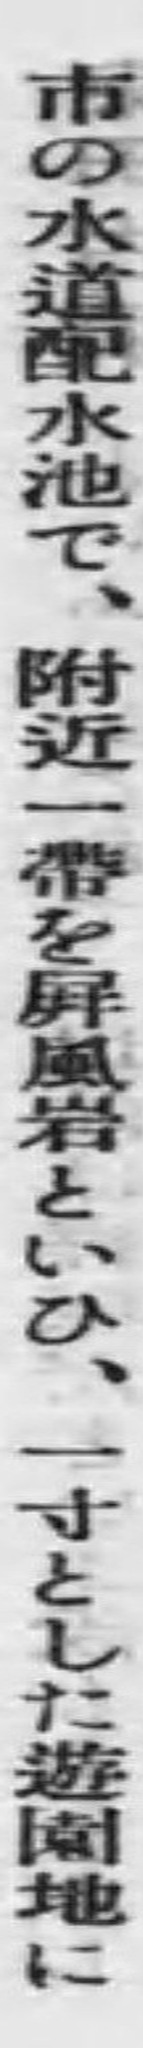市の水道配水池で、附近一帯を屏風岩といひ、一寸とした遊園地に
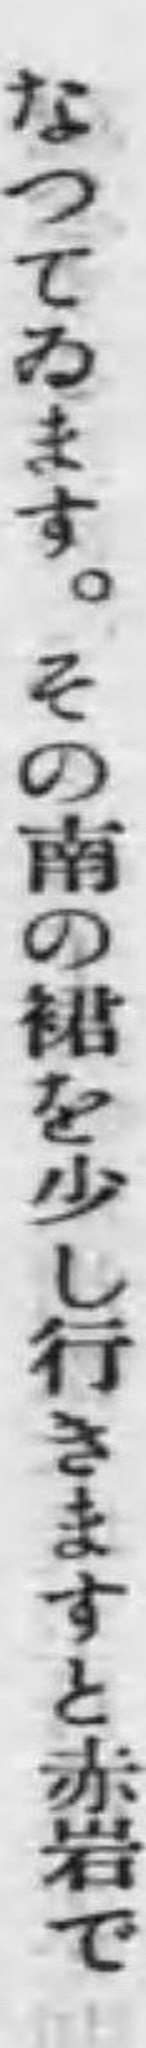なつてゐます。その南の裙を少し行きますと赤岩で
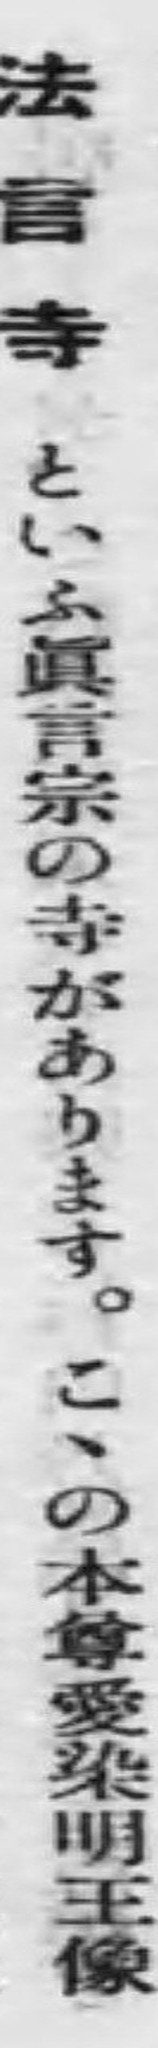法音寺といふ真言宗の寺があります。こゝの本尊愛染明王像
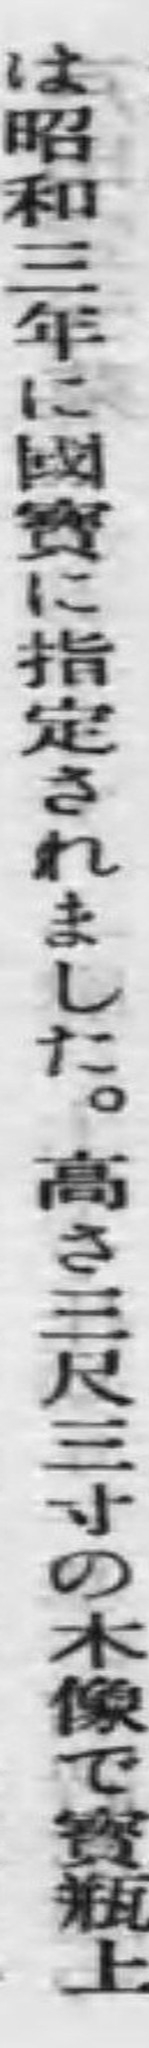は昭和三年に国宝に指定されました。高さ三尺三寸の木像で宝瓶上
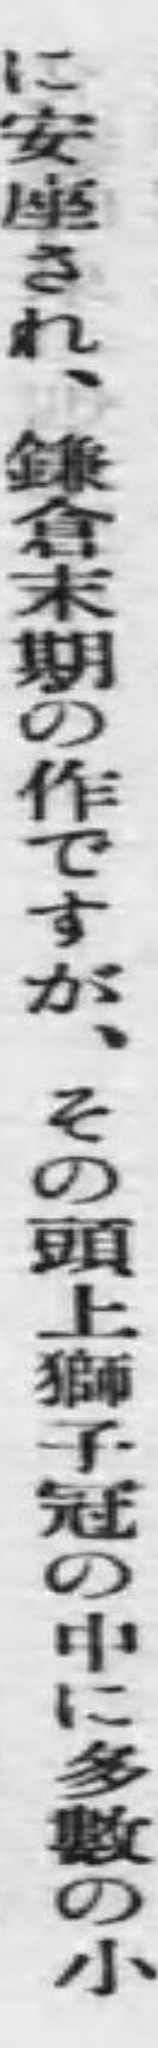に安座され、鎌倉末期の作ですが、その頭上獅子冠の中に多数の小
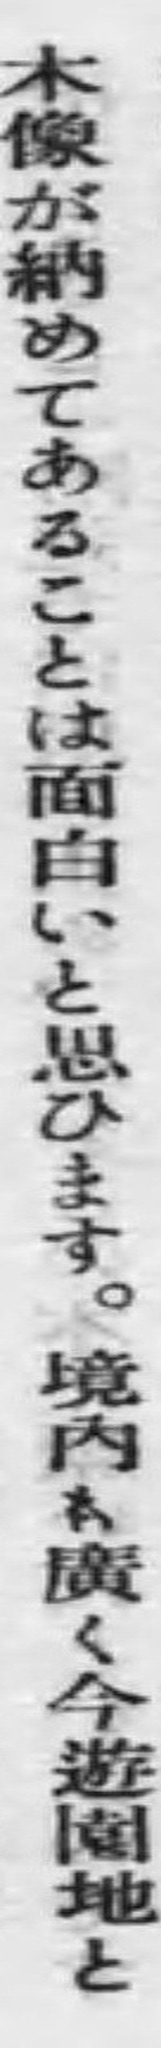木像が納めてあることは面白いと思ひます。境内も広く今遊園地と
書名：東三河道中記 : 豊橋市及其附近案内
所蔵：国立国会図書館 National Diet Library, JAPAN
